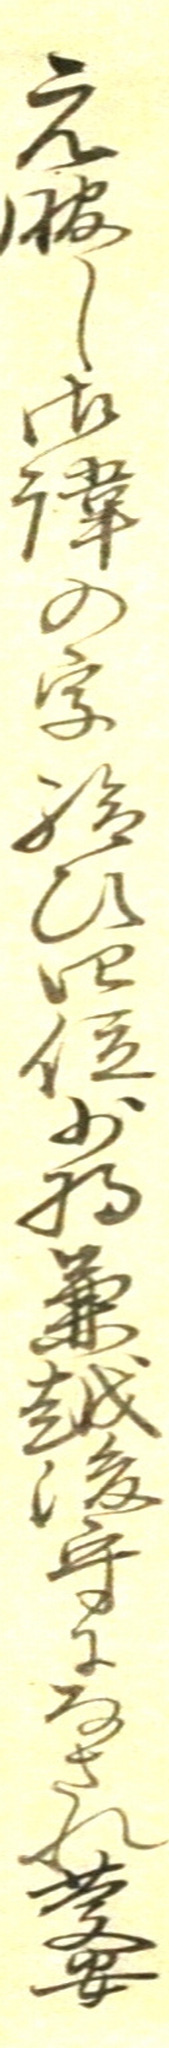元服し御諱の字給ひ四位少将兼越後守になされ慶安
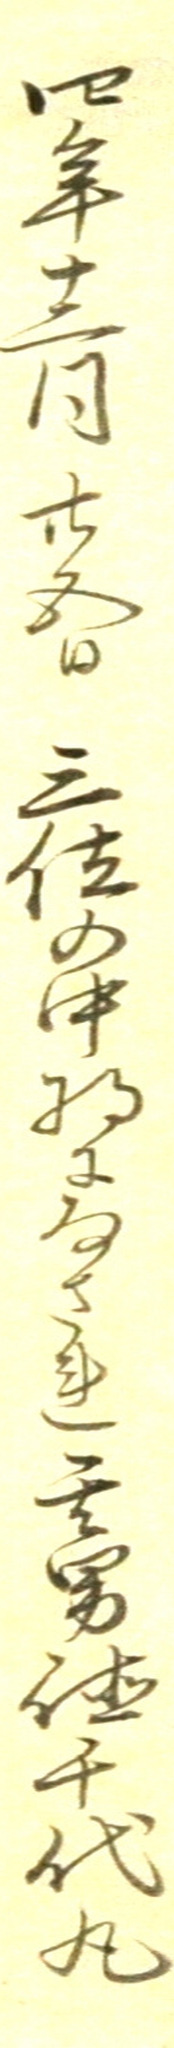四年十二月廿五日三位の中将になされ其男徳千代丸
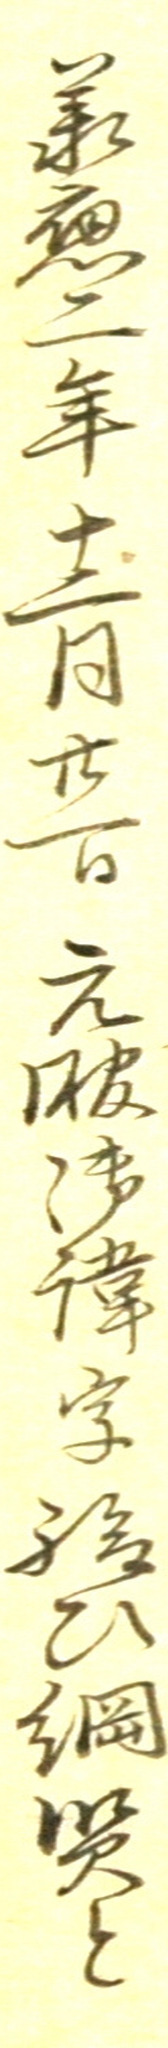承応二年十二月廿一日元服御諱字給ひ綱賢と

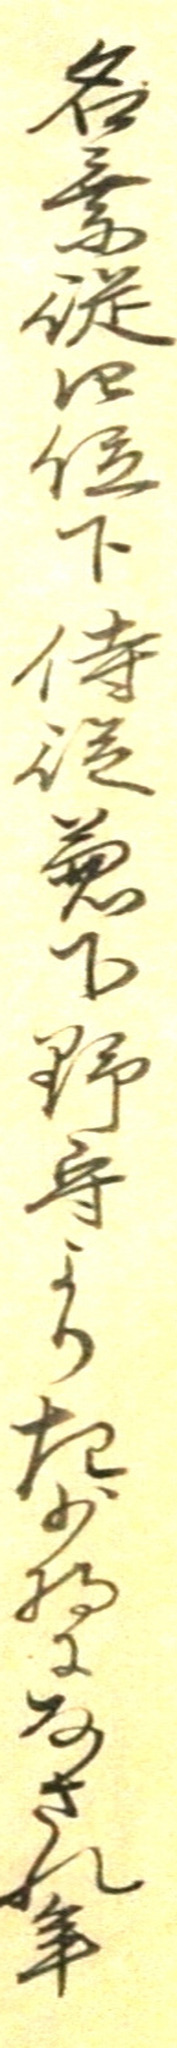名乗従四位下侍従兼下野守より左少将になされ年
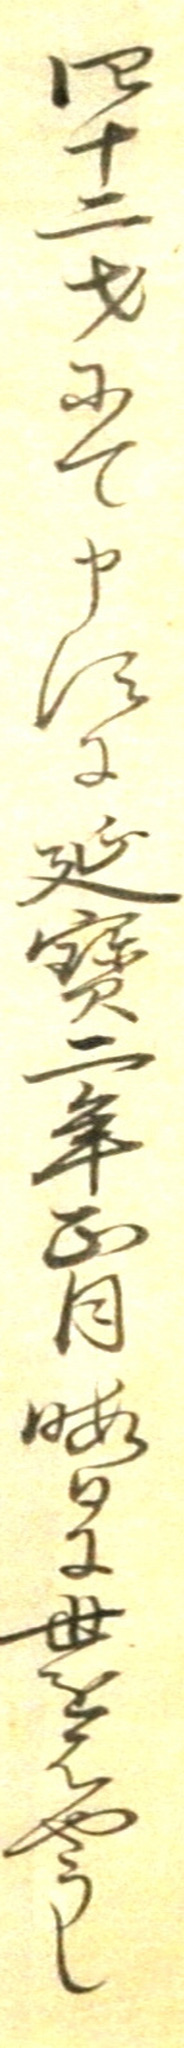四十二才にて申すに延宝二年正月晦日に世をはやうし
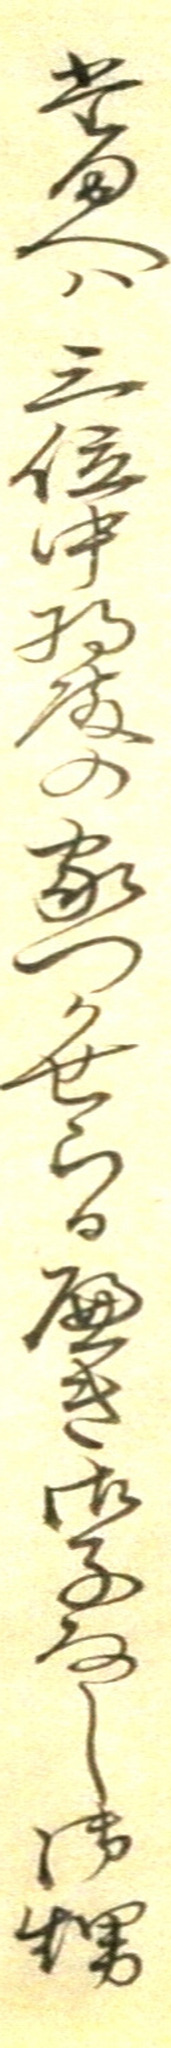たまへは三位中将殿の家つかせらるへき御子なし御甥
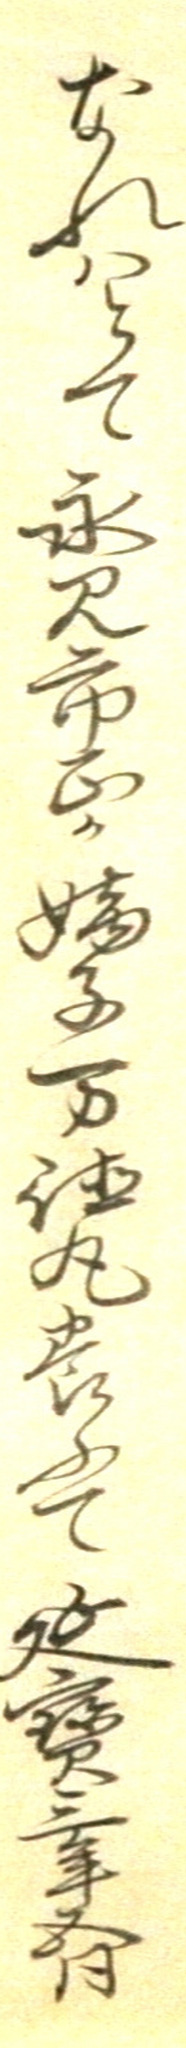なれはとて永見市正か嫡子万徳丸養ふて延宝三年五月
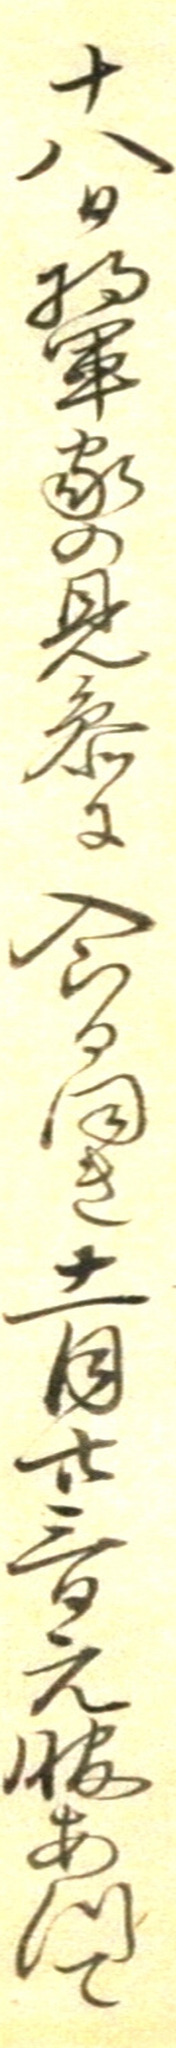十八日将軍家の見参に入らる同き十一月廿三日元服あつて
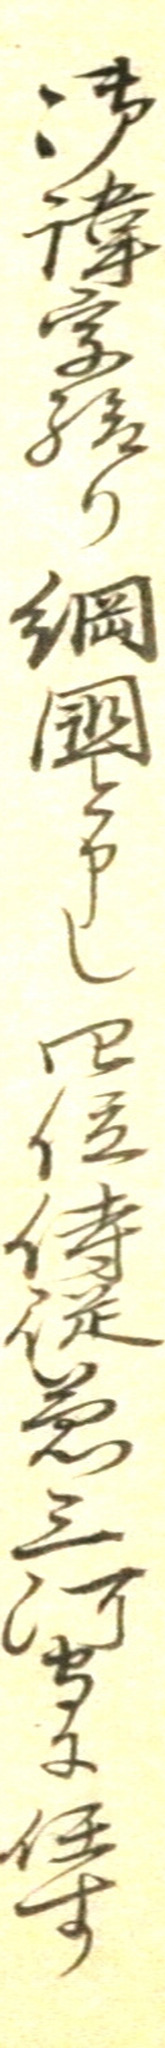御諱字給り綱国と申し四位侍従兼三河守に任す
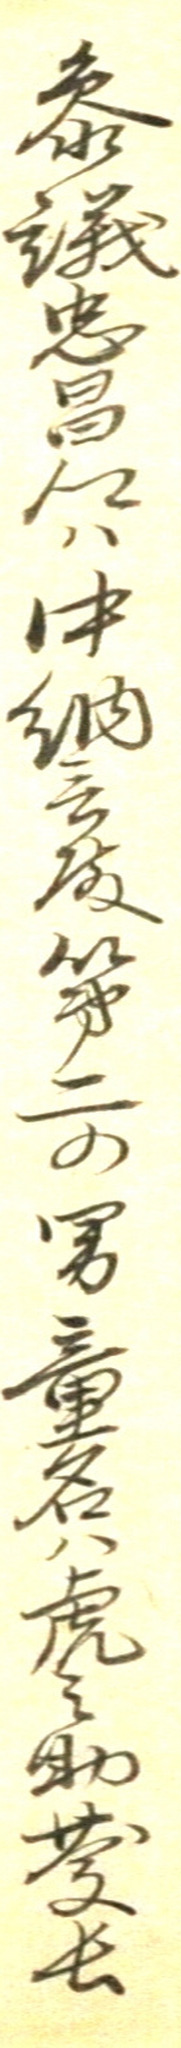参議忠昌卿は中納言殿第二の男童名は虎之助慶長
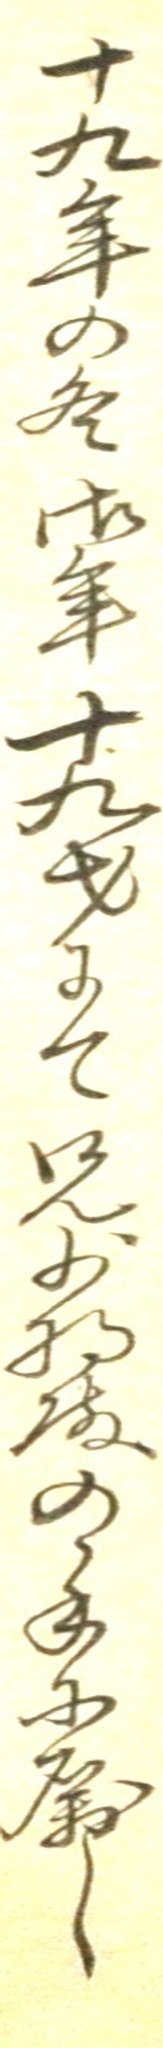十九年の冬御年十九才にて兄少将殿の手に属し
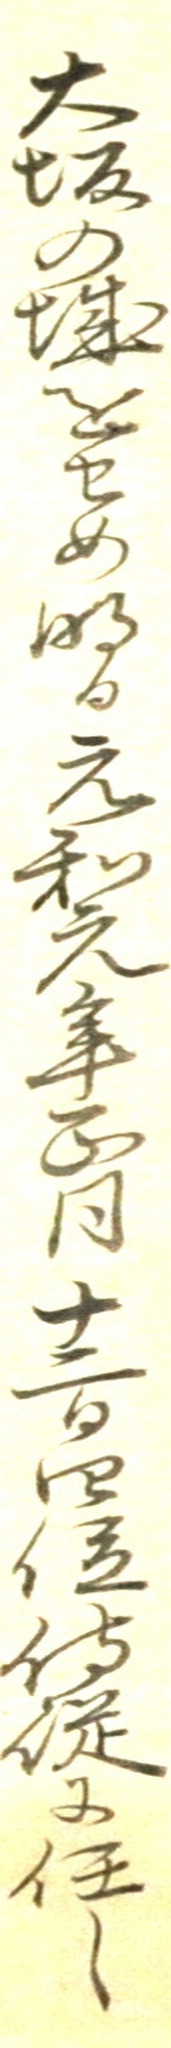大坂の城をせめ明る元和元年正月十二日四位侍従に任し
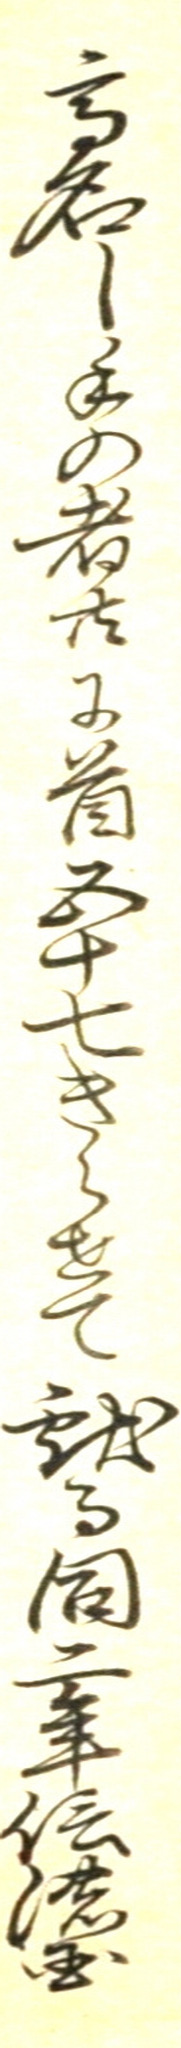高名し手の者共に首五十七きらせて献る同二年信濃国
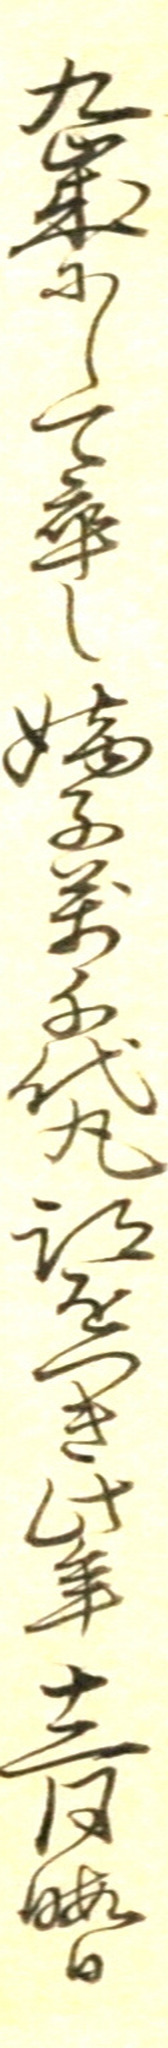九歳にして卒し嫡子万千代丸跡をつき此年十二月晦日
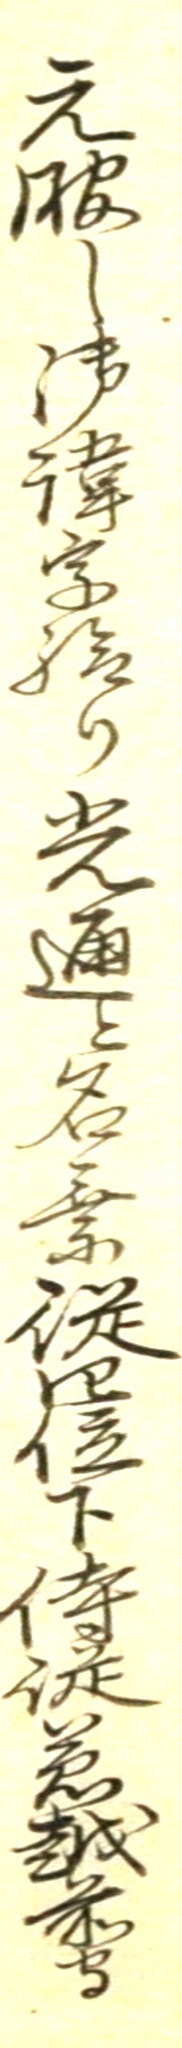元服し御諱字給り光通と名乗従四位下侍従兼越前守
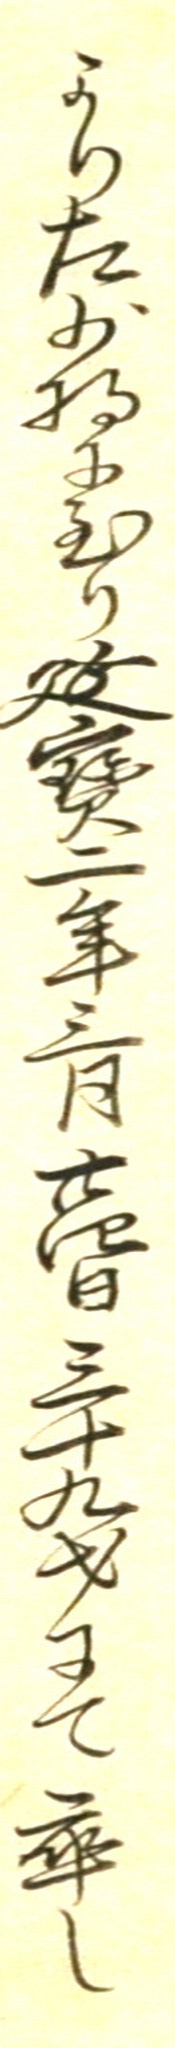より左少将に至り延宝二年三月廿四日三十九才にて卒し
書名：藩翰譜（一）
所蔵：伊那市立高遠町図書館・合同会社AMANE
